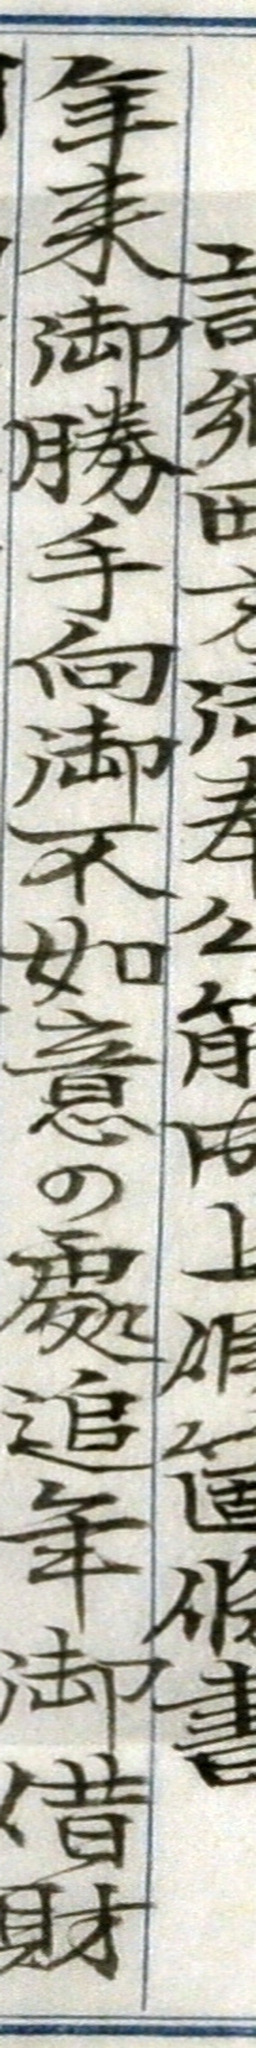年末御勝手向御不如意の処追年御借財
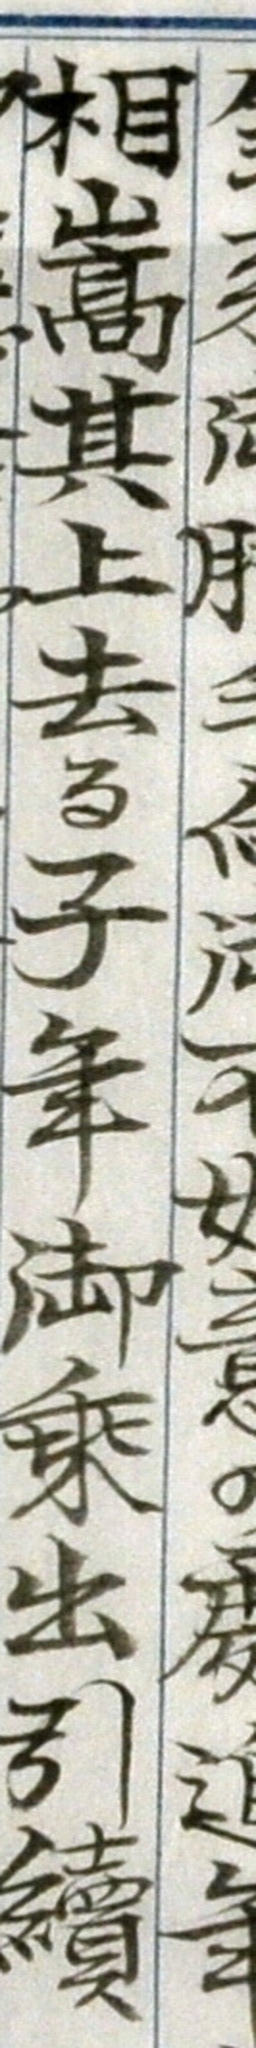相嵩其上去る子年御乗出引続
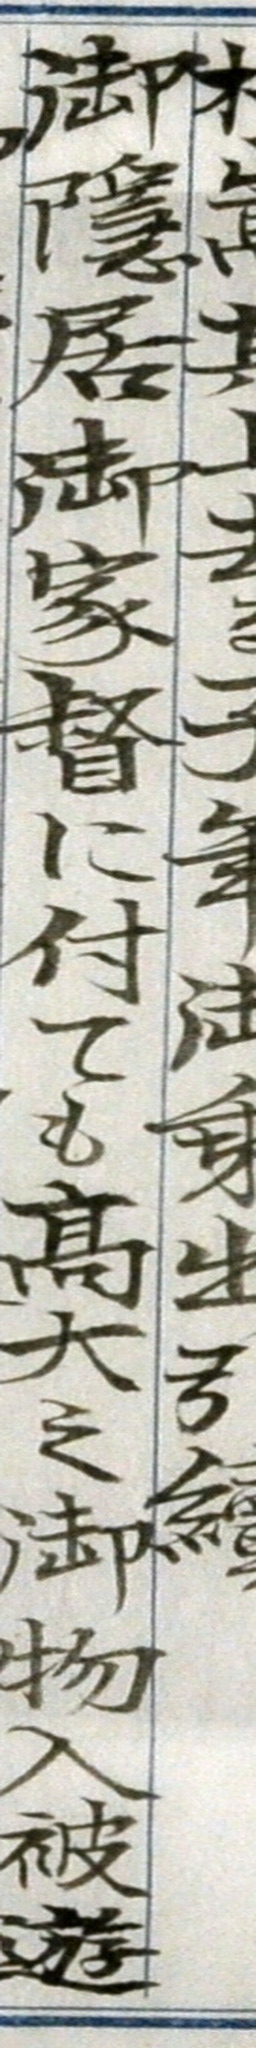御隠居御家督に付ても高大之御物入被遊
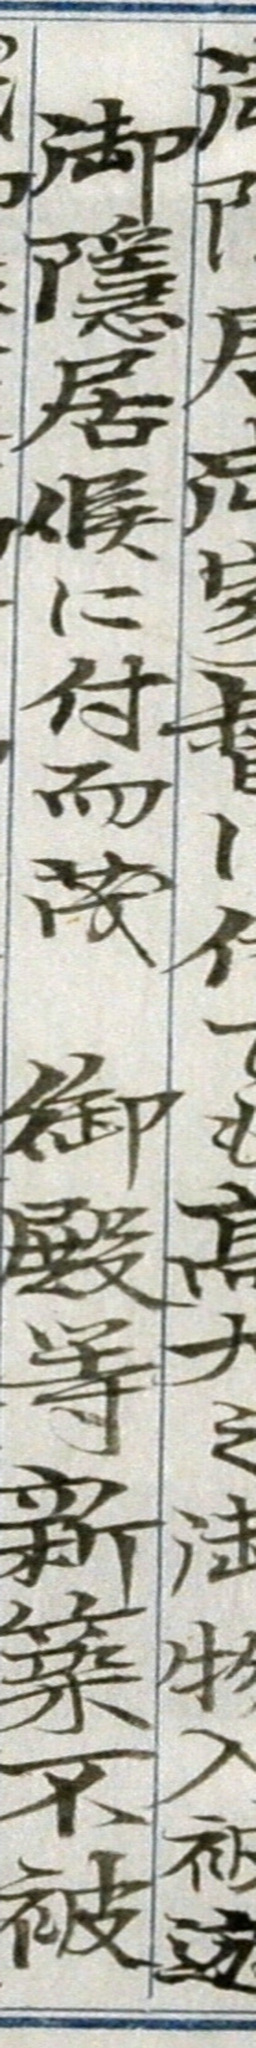御隠居候に付而茂御殿等新築不被
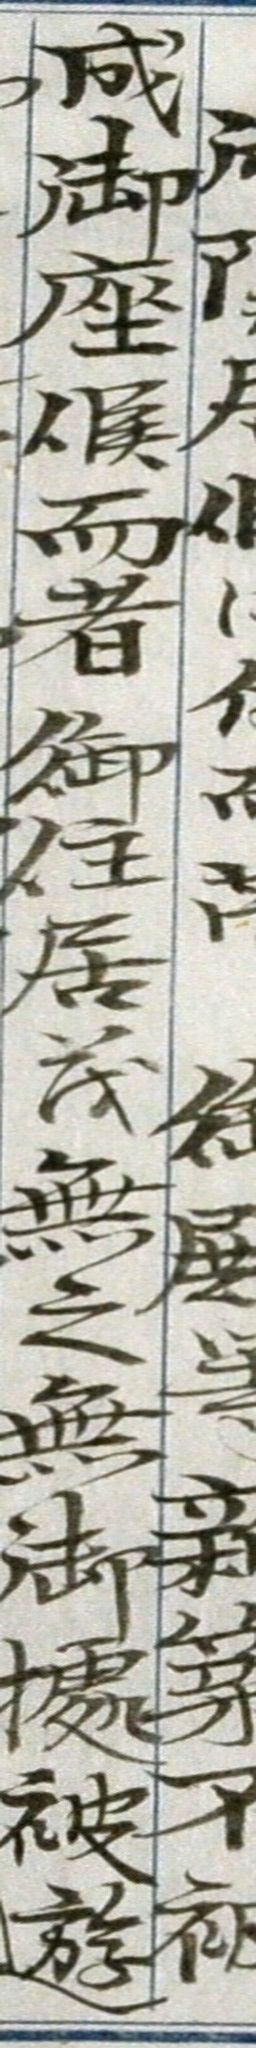成御座候而者御住居茂無之無御拠被遊
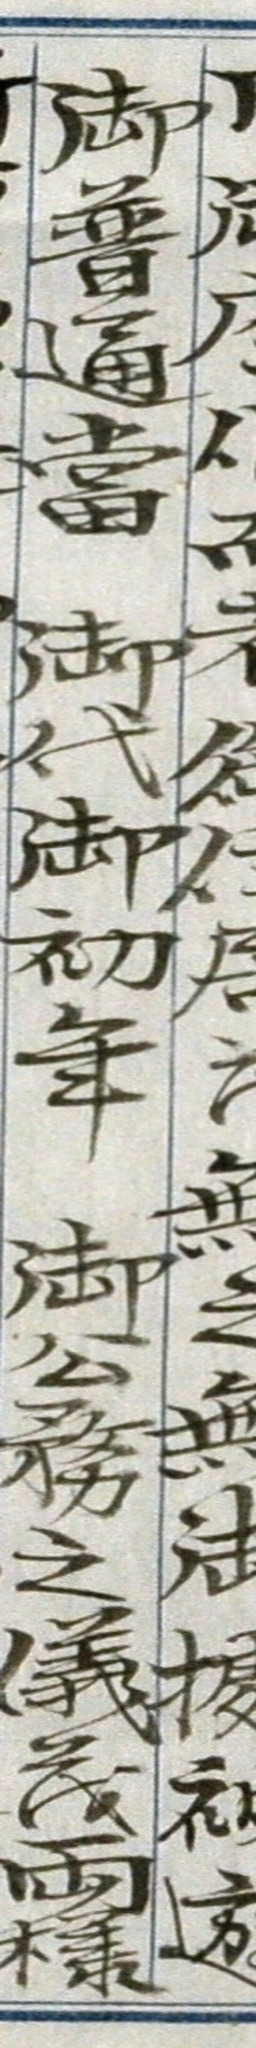御普通当御代御初年御公務之儀茂両様
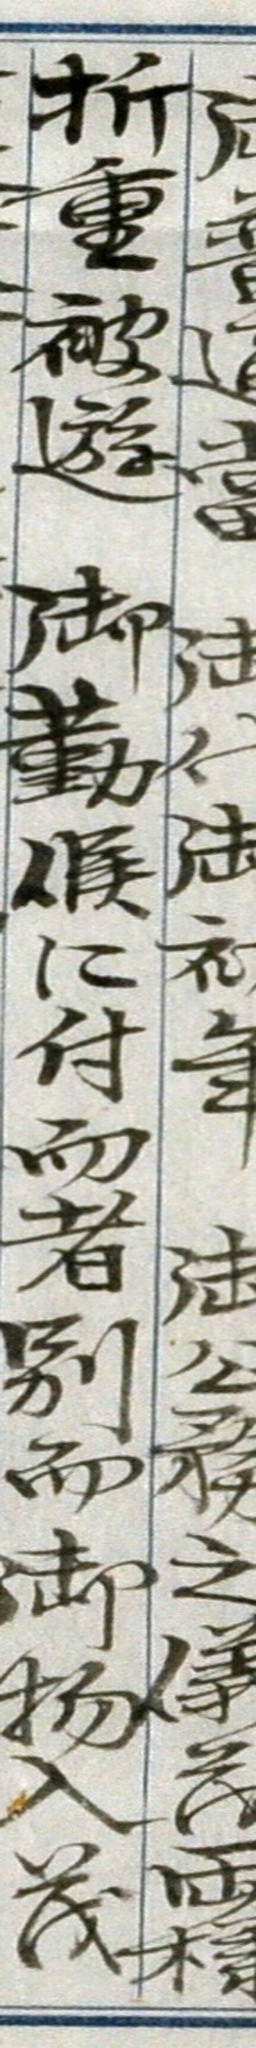折重被遊御勤候に付而者別而御物入茂
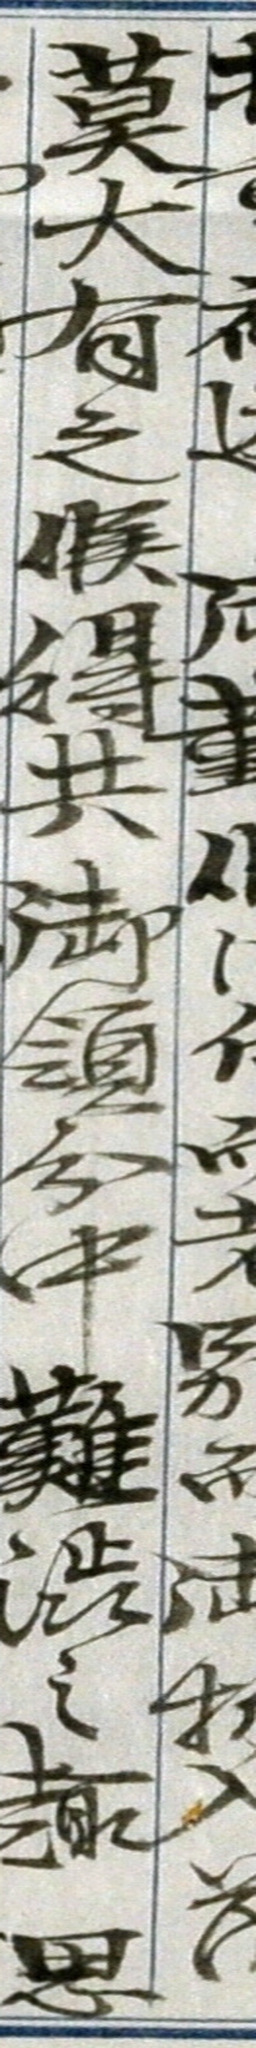莫大有之候得共御領分中難渋之趣思
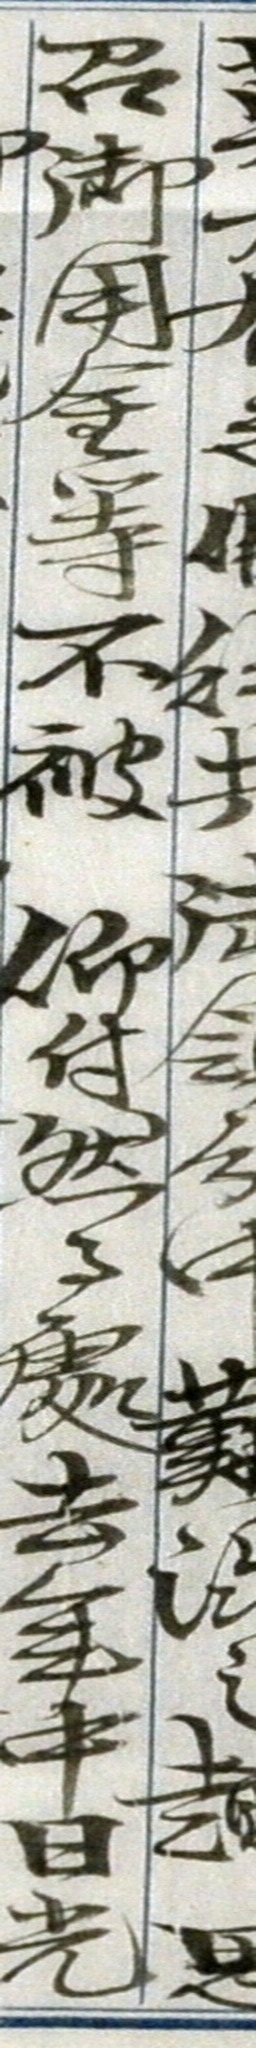召御用金等不被仰付然る処去年中日光
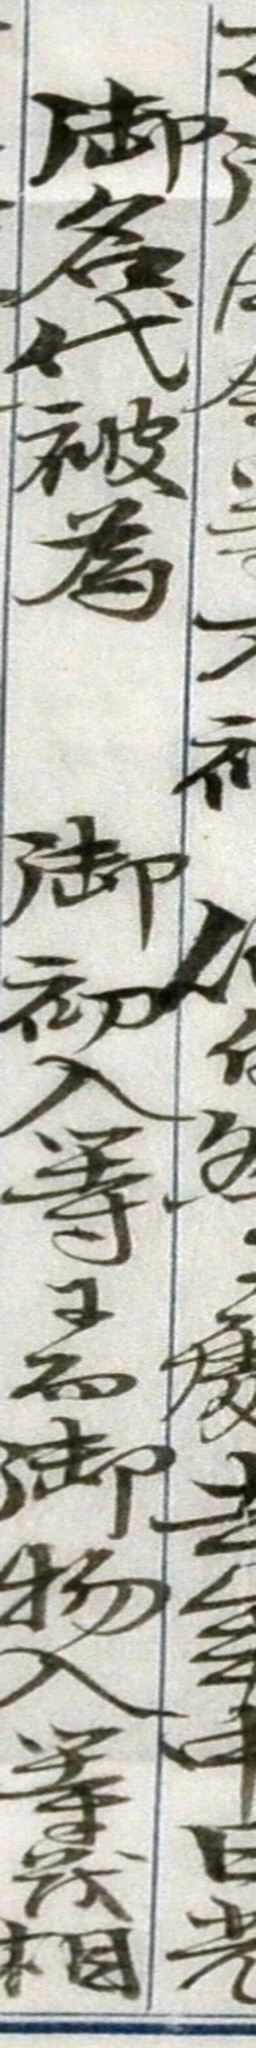御名代被為御初入等に而御物入等茂相
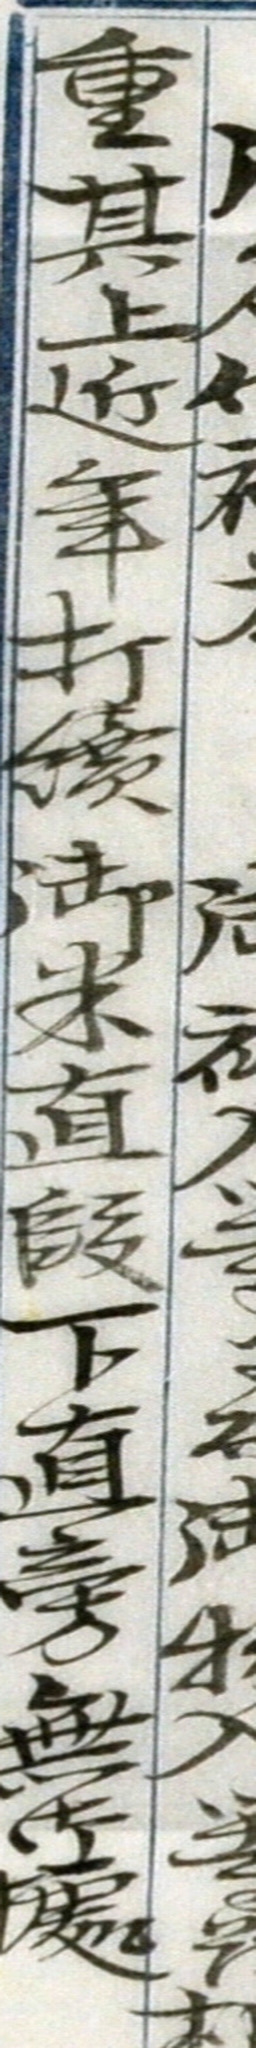重其上近年打続御米直段下直旁無御拠
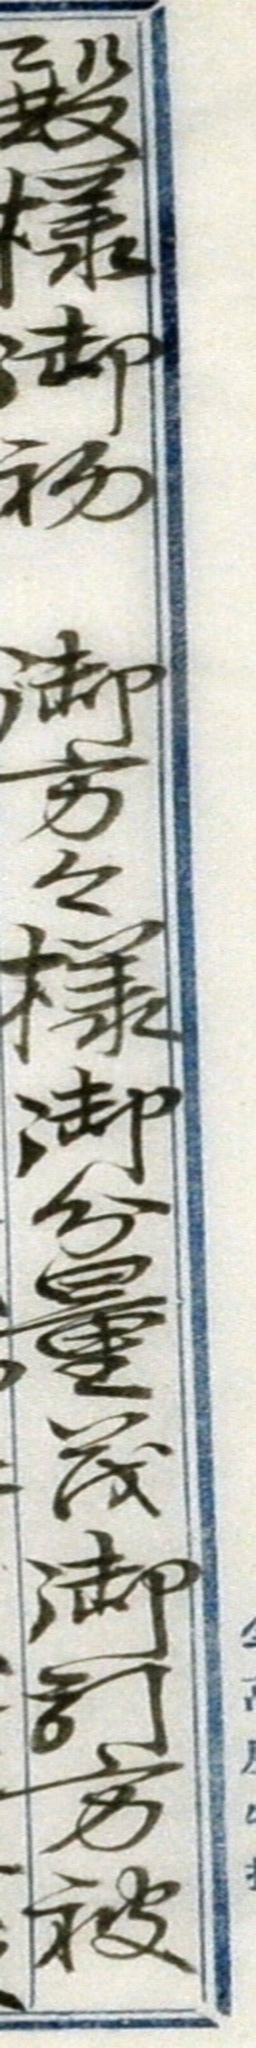殿様御初御方々様御分量茂御引方被
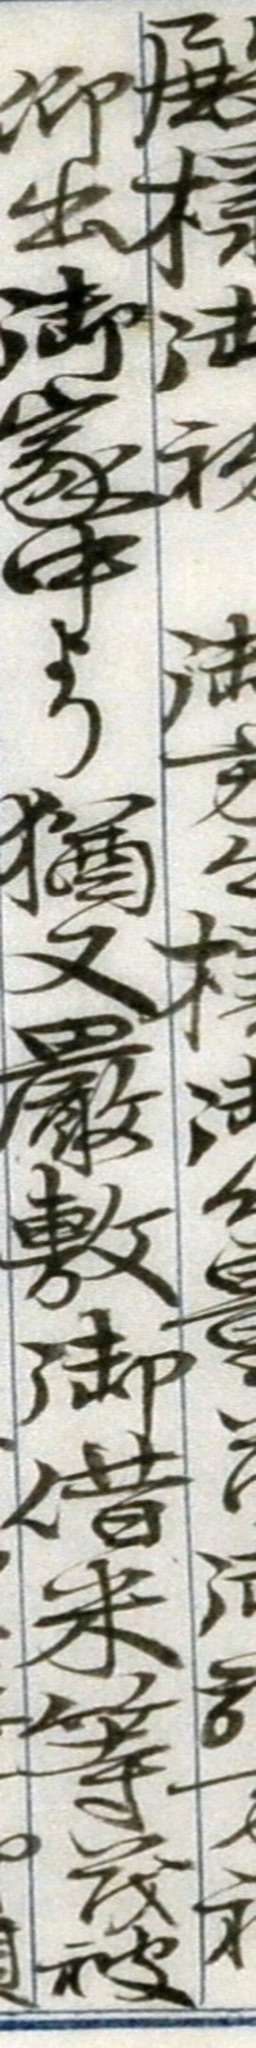仰出御家中より猶又厳敷御借米等茂被
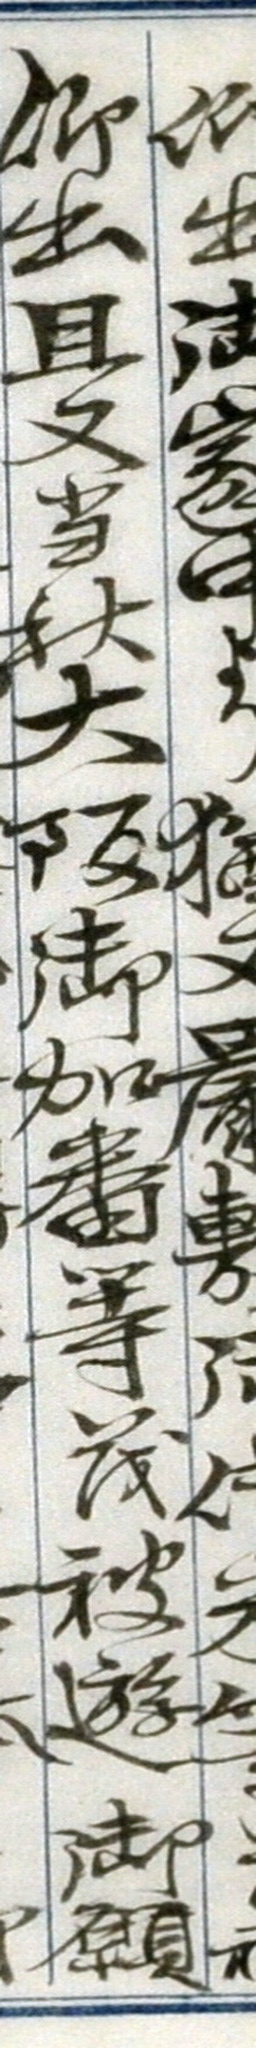仰出且又当秋大阪御加番等茂被遊御願
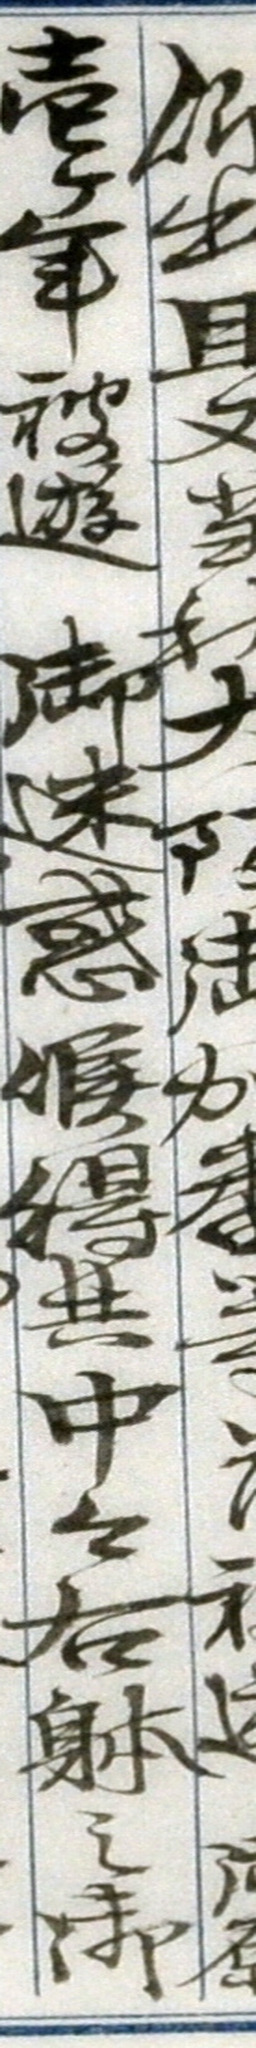壱ヶ年被遊御迷惑候得共中々右体之御
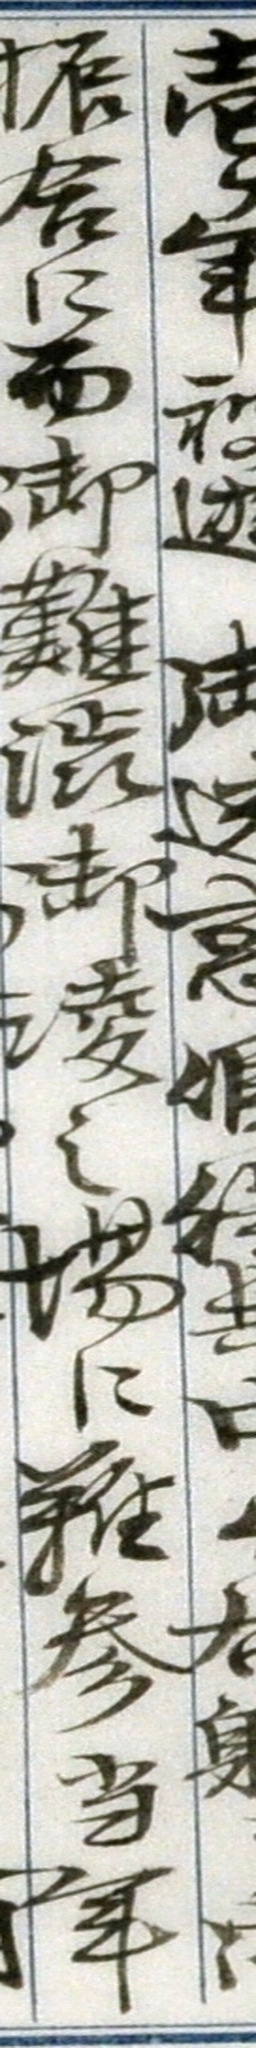振合に而御難渋御凌之場に難参当年
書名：倹約筋御沙汰書
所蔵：伊那市立高遠町図書館・合同会社AMANE
